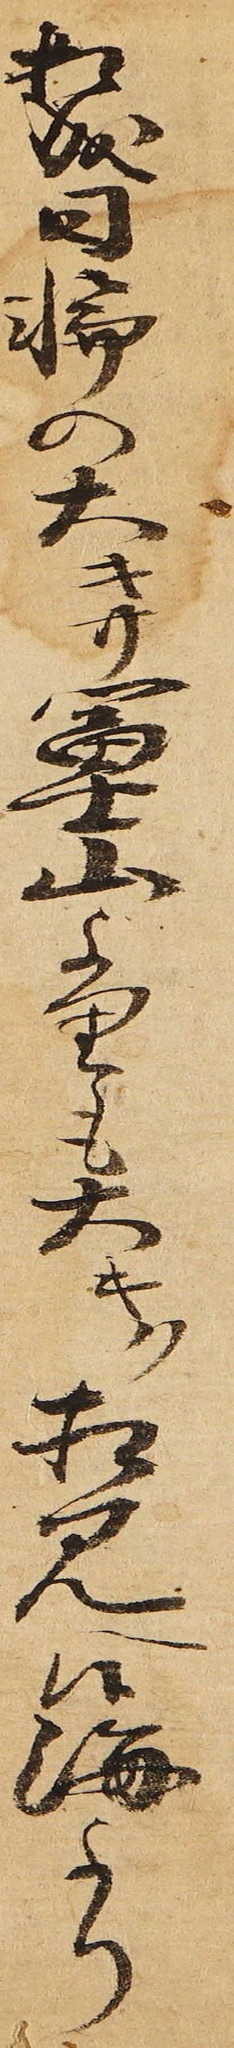相成日輪の大きさ富士山よりも大きく相見へ候海より
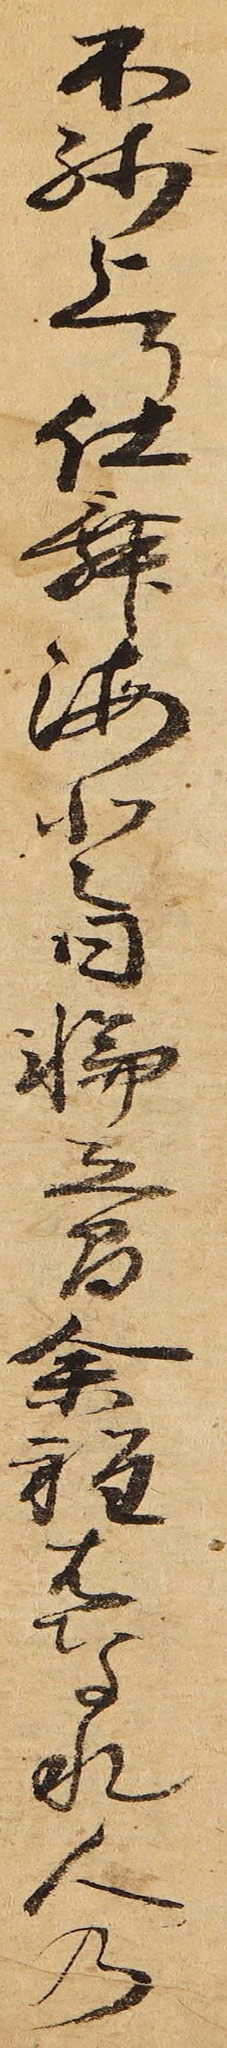不残上り仕舞海と日輪之間余程はなれ人の
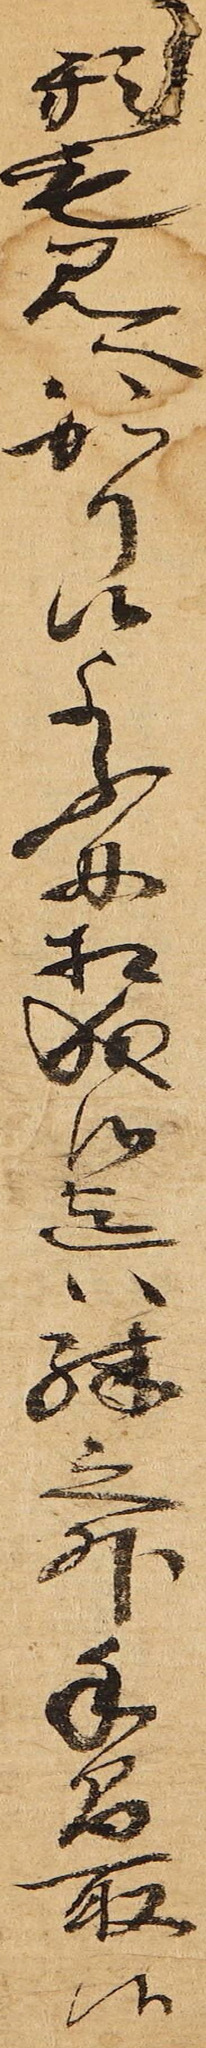形も見へはかり候よふに相成候迄は殊之外手間取候
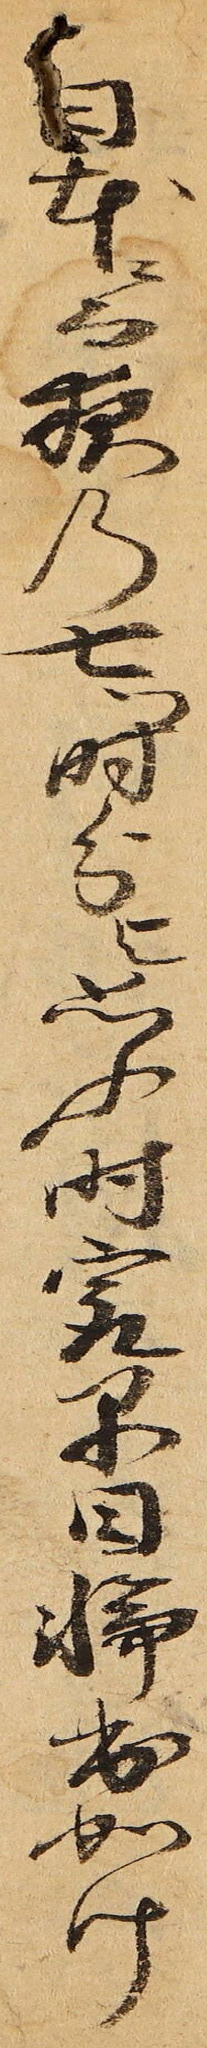日本にて夜の七ツ時分と思ふ時最早日輪出かけ
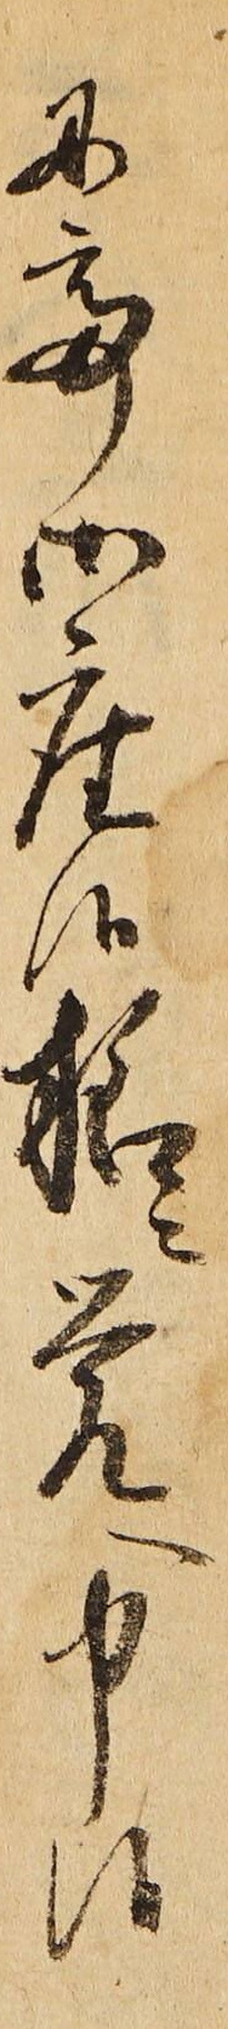にて御座候様に覚へ申候
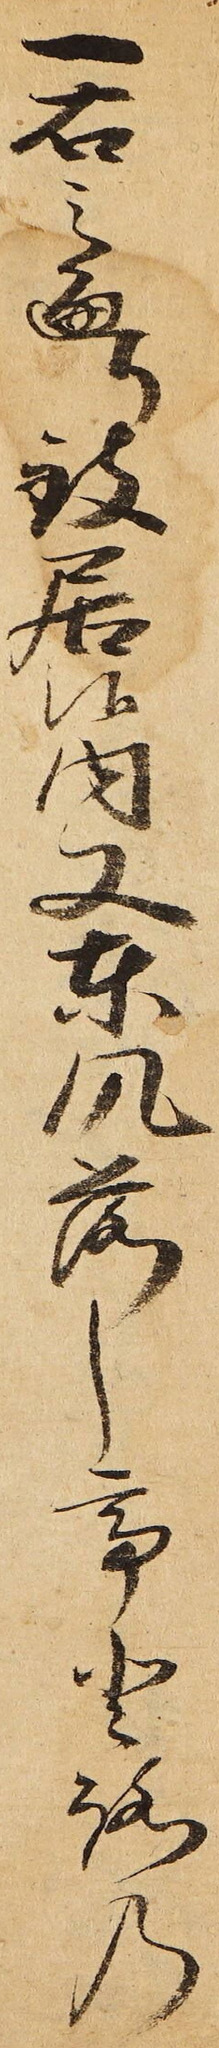一右之通り致居候内東風落してとろの
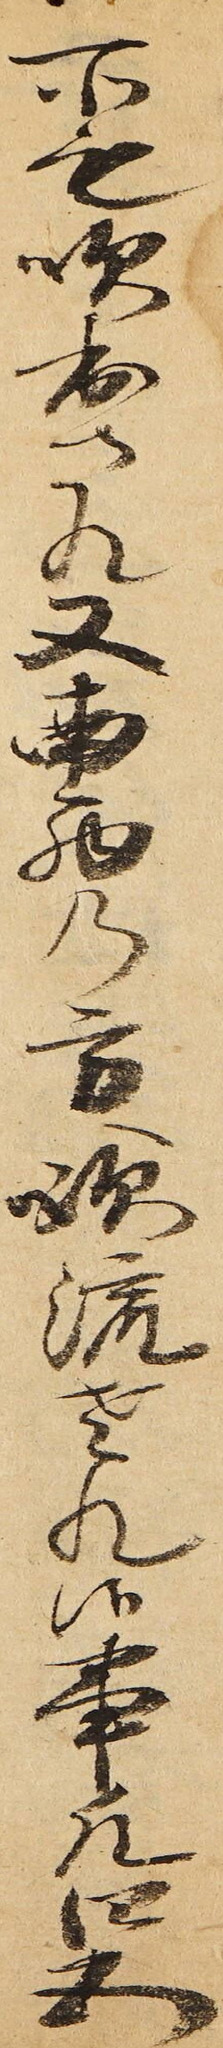所も吹出され又南西の方へ吹流され候事凡そ四五
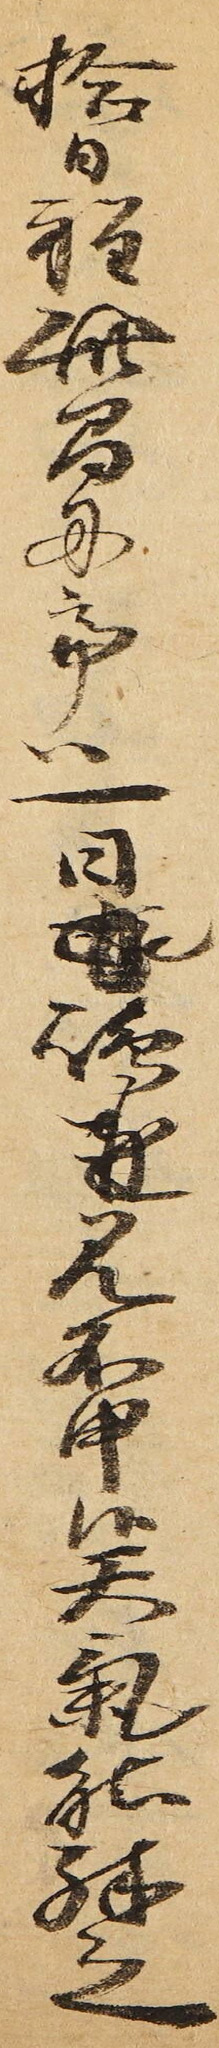拾日程此間にては一日も島を見不申候天気能殊之
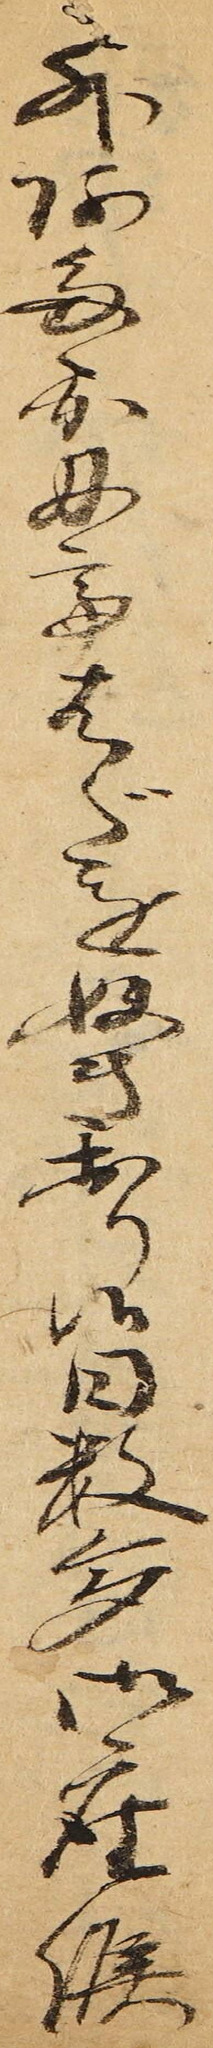外あたゝかにてはだをぬきおり候日数多御座候
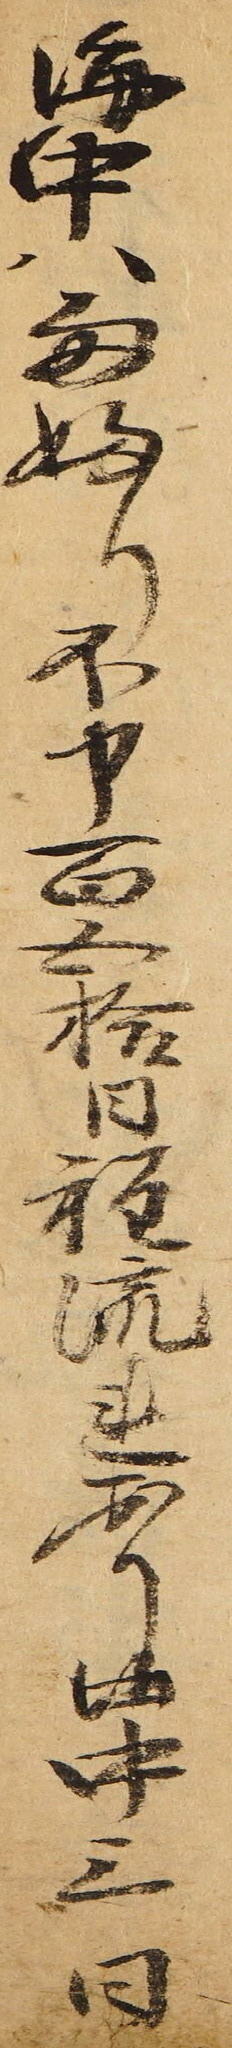海中はまふり不申百五拾日程流れおり候中三日
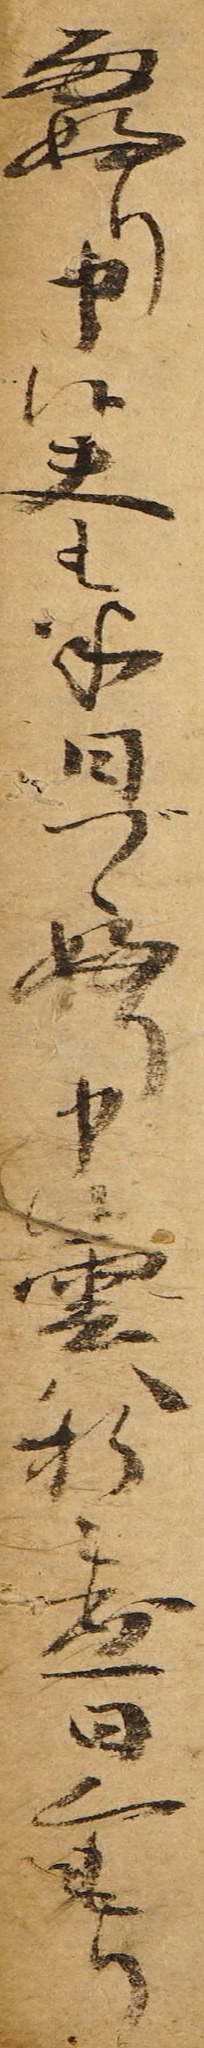雨ふり申候夫も半日づゝふり申候雲は折々出一日くもり

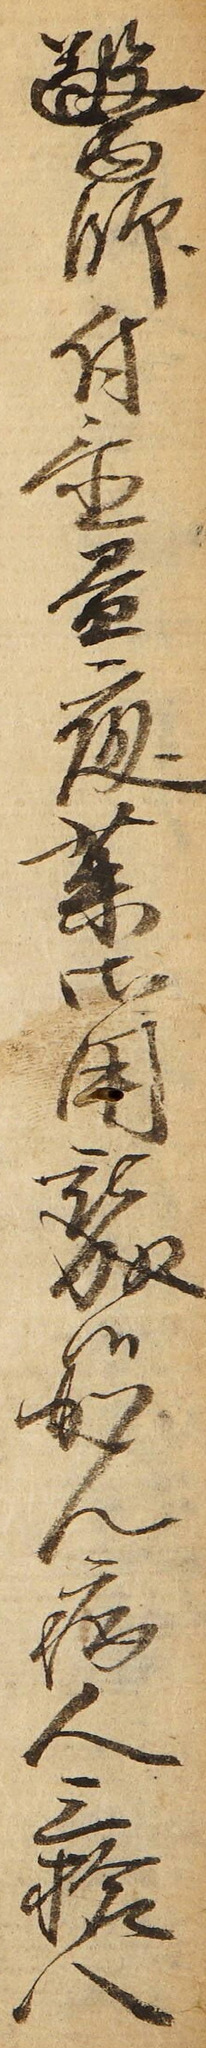医師付置昼夜薬御用被成候かん病人三拾人
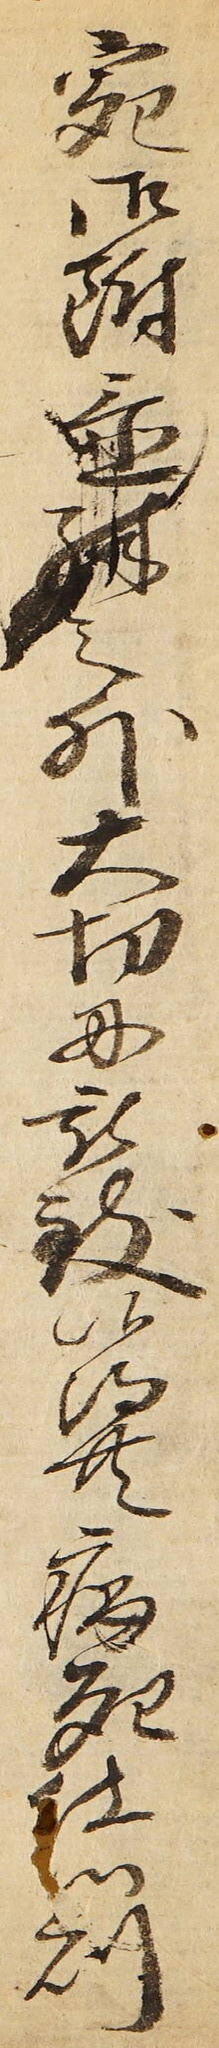宛御附置殊之外大切に被致候得共病死仕候刻
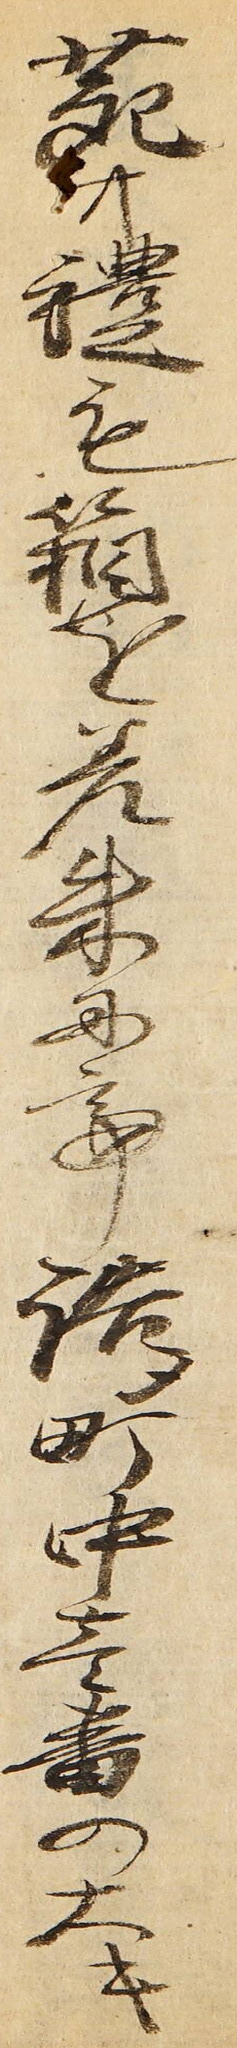葬礼も箱を差朱にて詰しめ町中壱番の大き
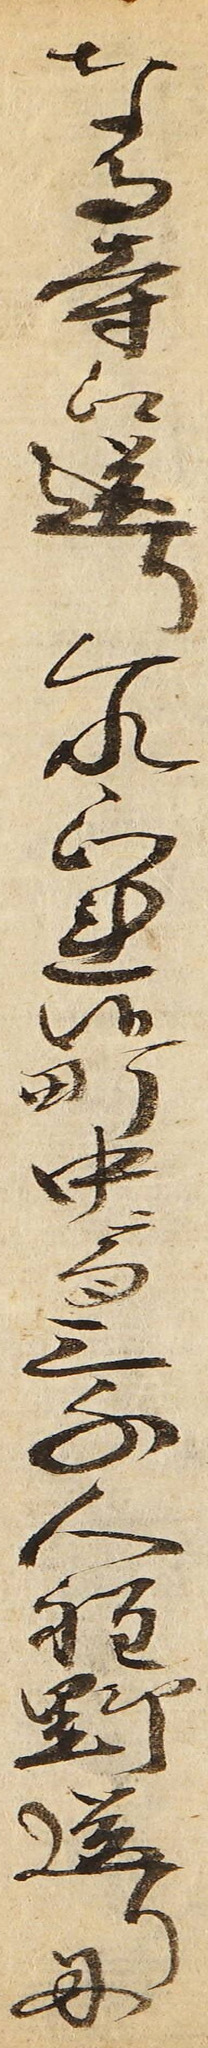なる寺え送りくれられ候町中にて三千人程野送りに
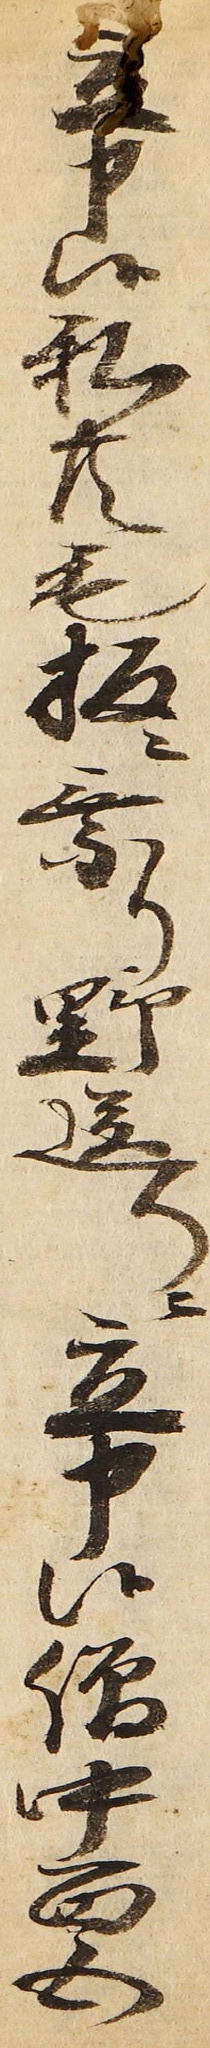立申候私共も板に乗り野送りに立申候僧中百五
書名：志州鳥羽流船留書
